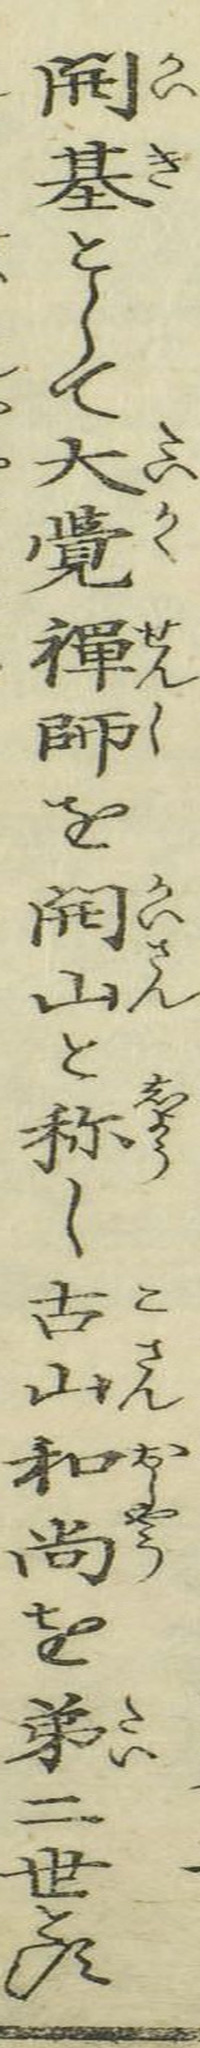開基として大覺禪師を開山と称し古山和尚を弟二世とす
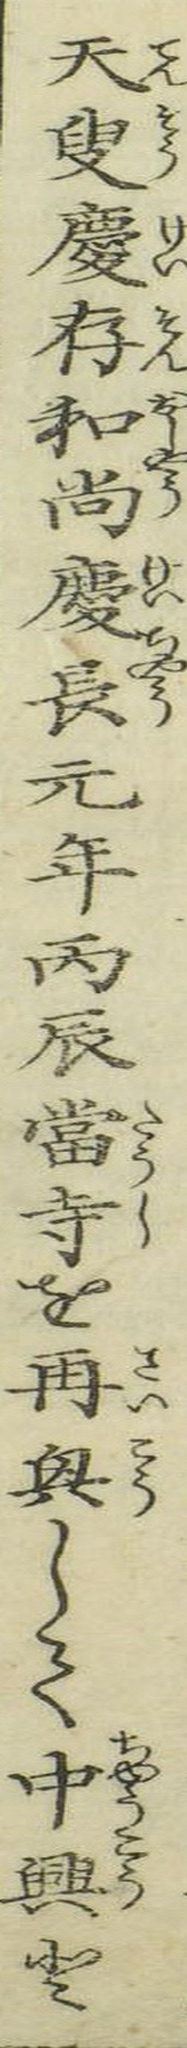天叟慶存和尚慶長元年丙辰當寺を再興して中興と

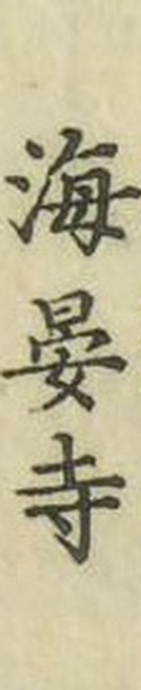海晏寺

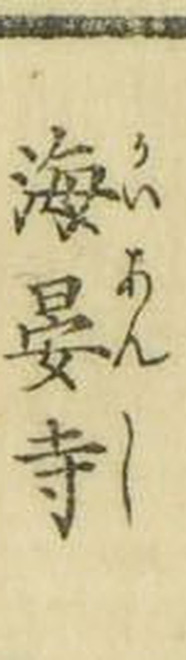海晏寺
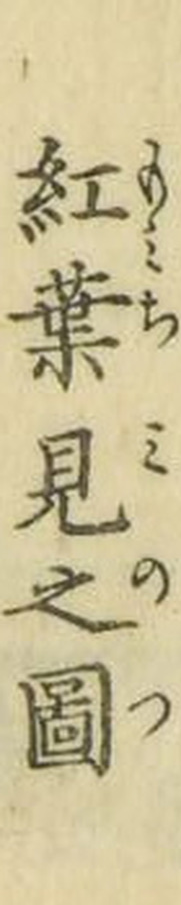紅葉見之圖
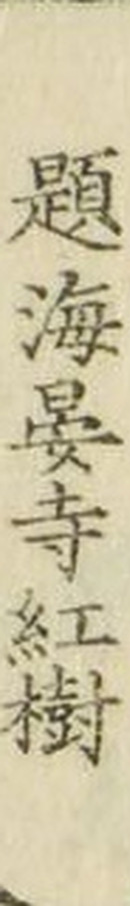題海晏寺紅樹
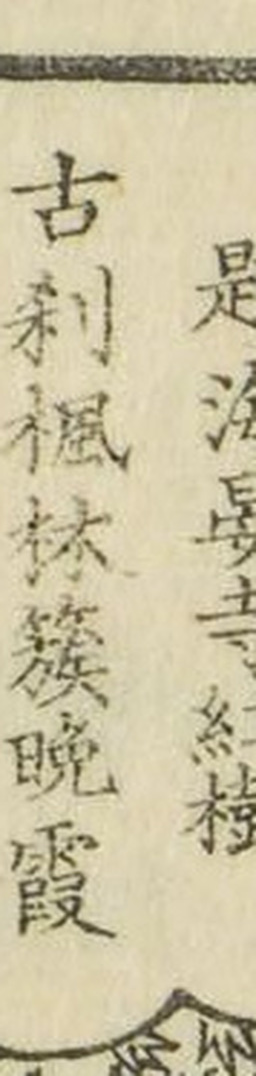古刹楓林簇晩霞
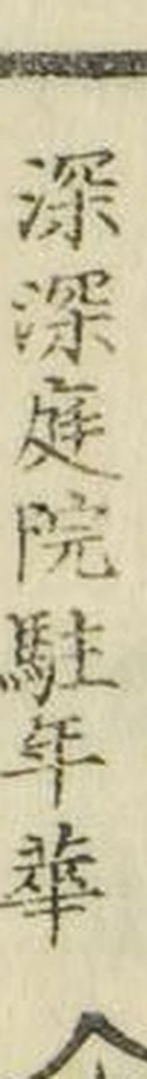深深庭院駐年華
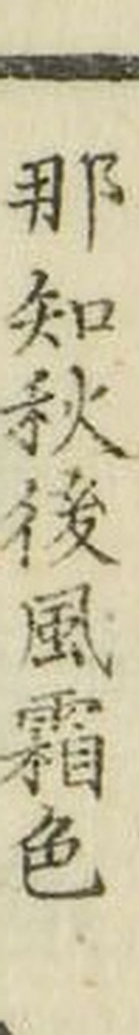那知秋後風霜色
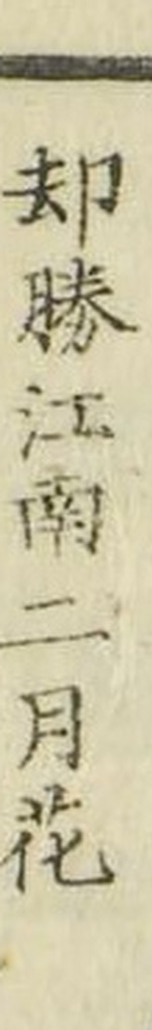却勝江南二月花

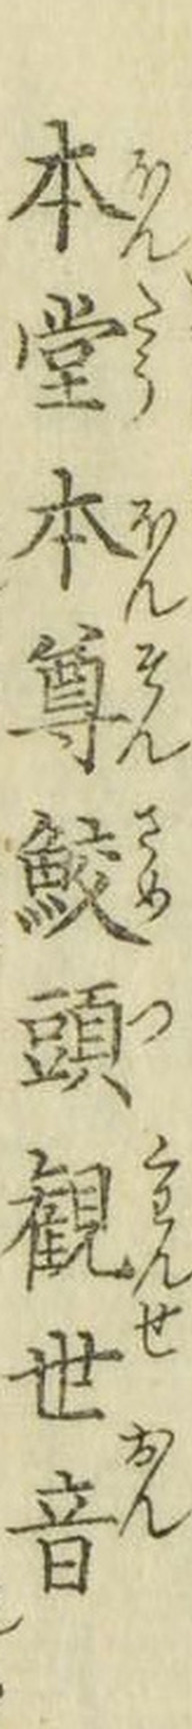本堂本尊鮫頭観世音
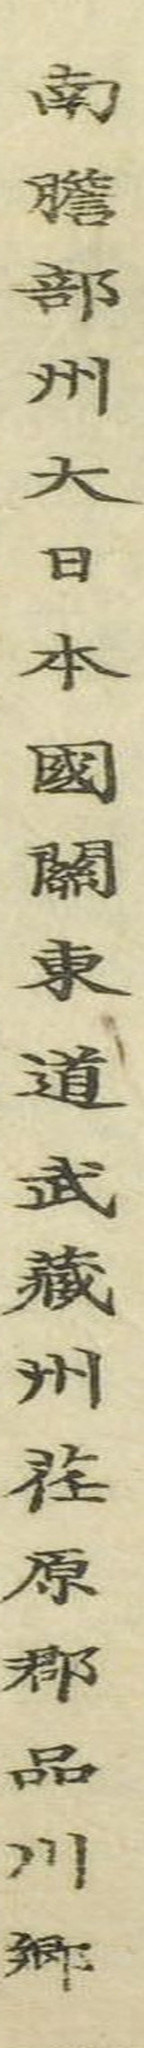南膽部州大日本國關東道武藏州荏原郡品川郷
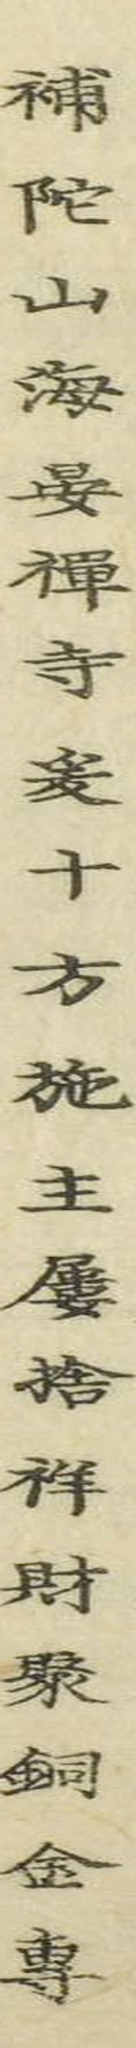補陀山海晏禪寺爰十方施主屢捨祥財聚銅金専
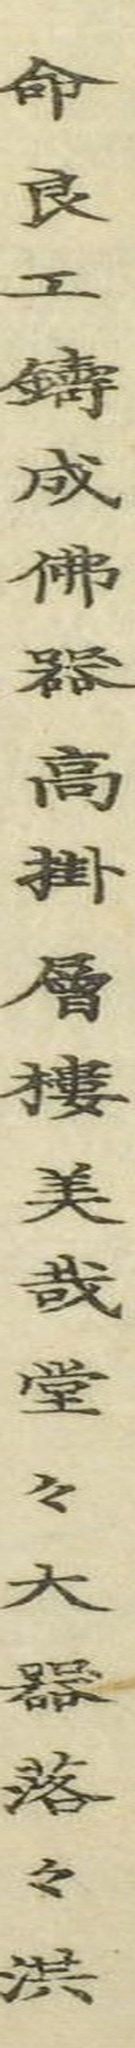命良工鑄成佛器高掛層樓美哉堂々大器落々洪
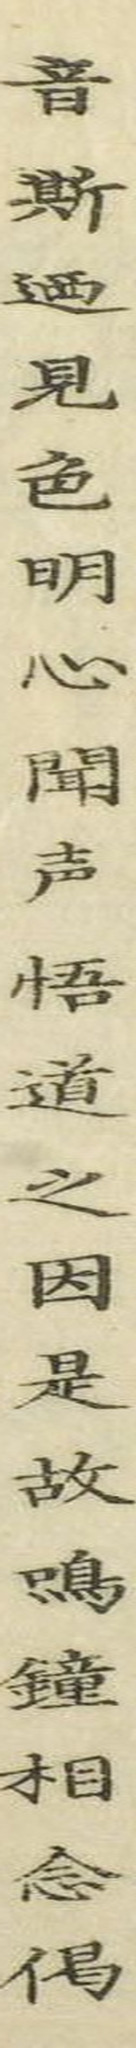音斯迺見色明心聞声悟道之因是故鳴鐘相念偈
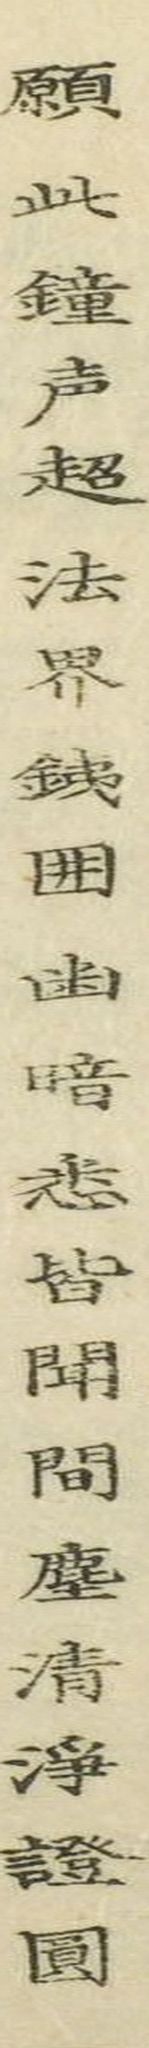願此鐘声超法界銕囲暗悉皆聞間塵清淨證圓
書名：江戸名所図会 20巻 巻之4
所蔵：東京学芸大学教育コンテンツアーカイブ
